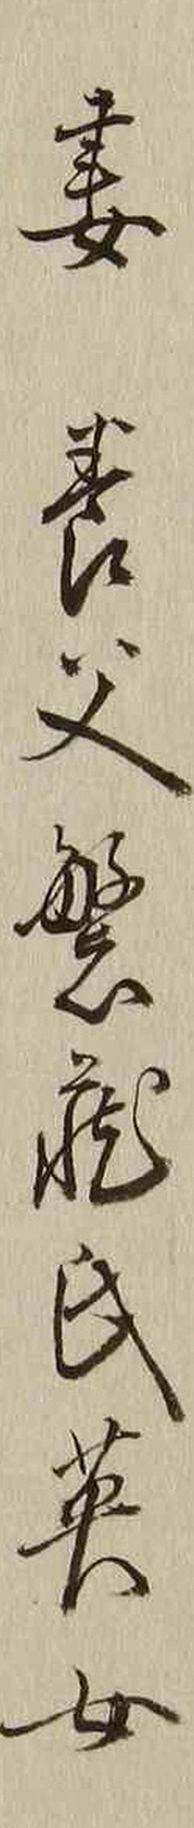妻養父繁蔵氏英女
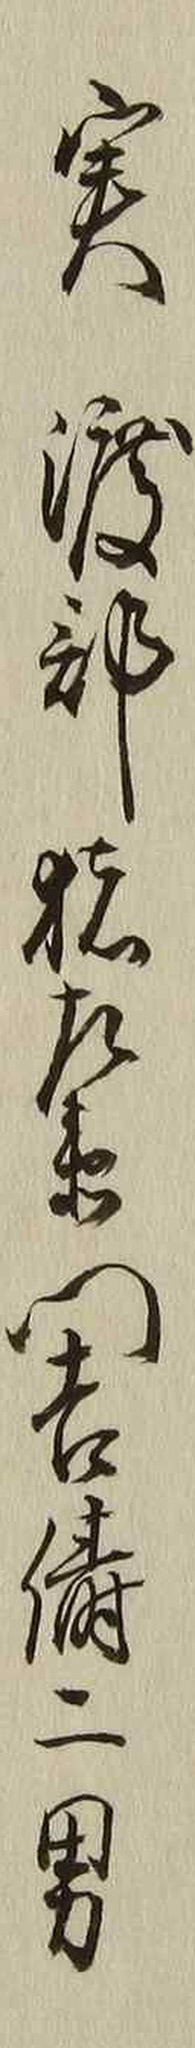実渡部猪左衛門吉俦二男
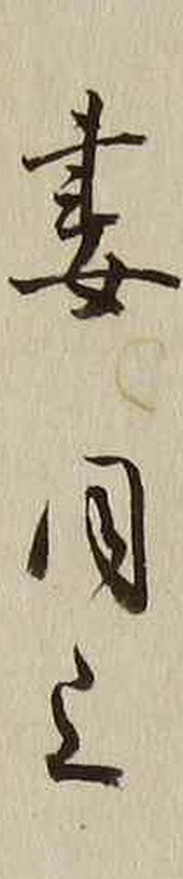妻同上
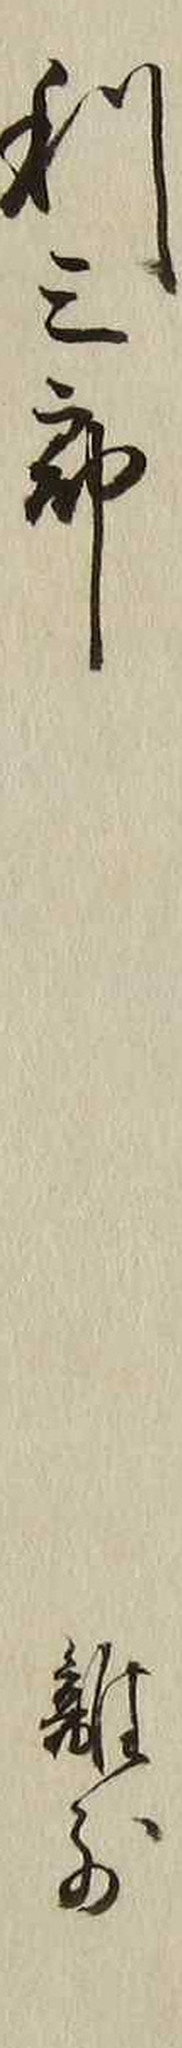利三郎離別
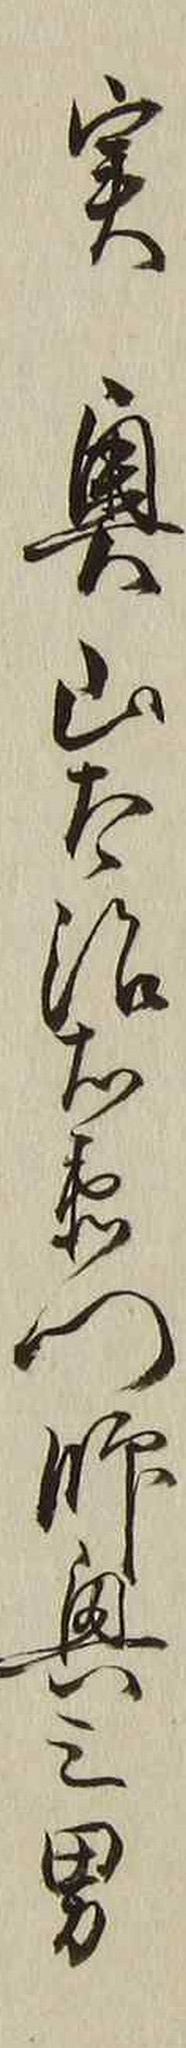実奥山太治右衛門師興三男
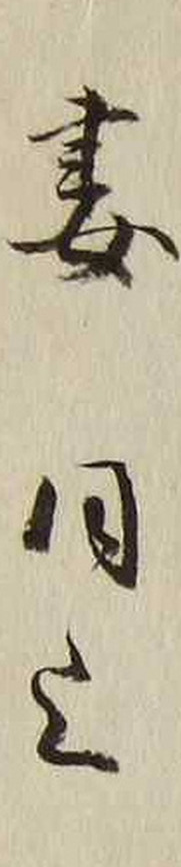妻同上

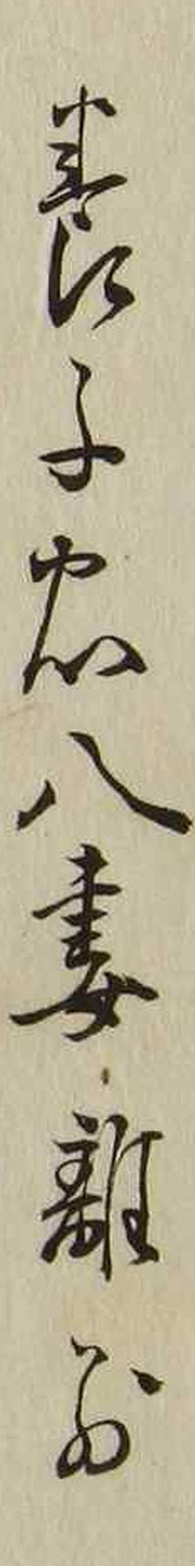養子忠八妻離別
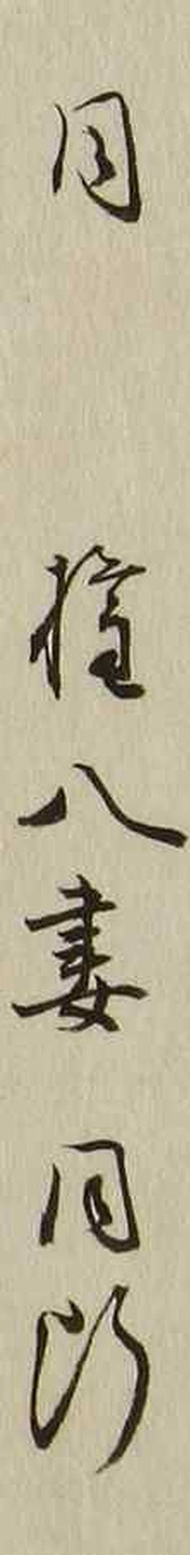女同権八妻同断
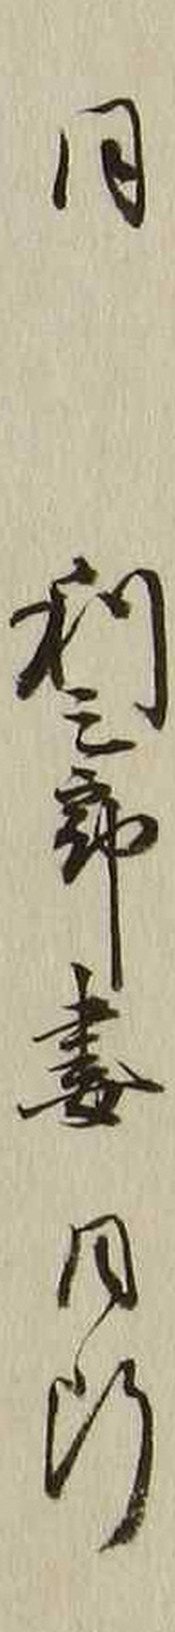同利三郎妻同断
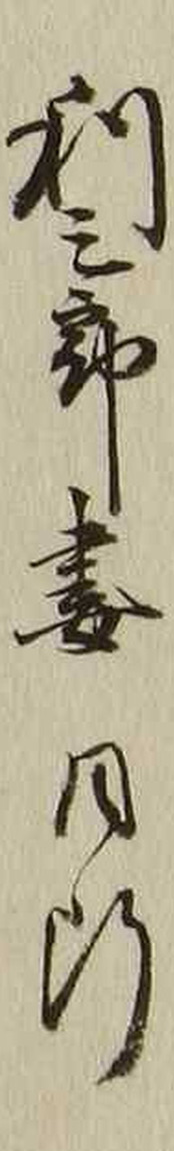同利三郎妻同断
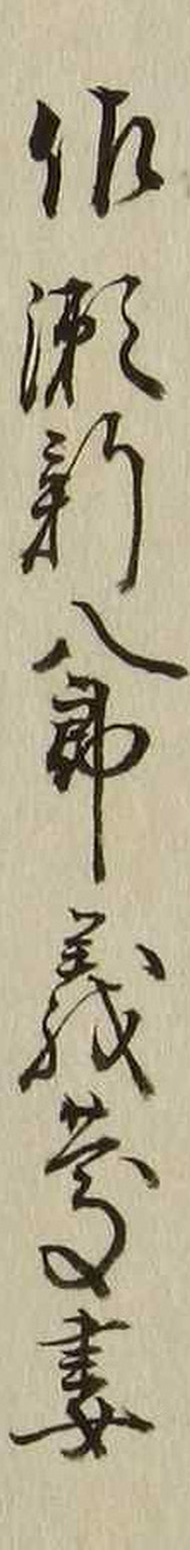佐瀬新八郎義慶妻
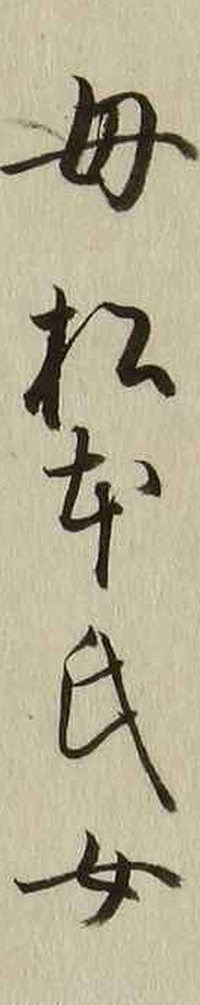母松本氏女
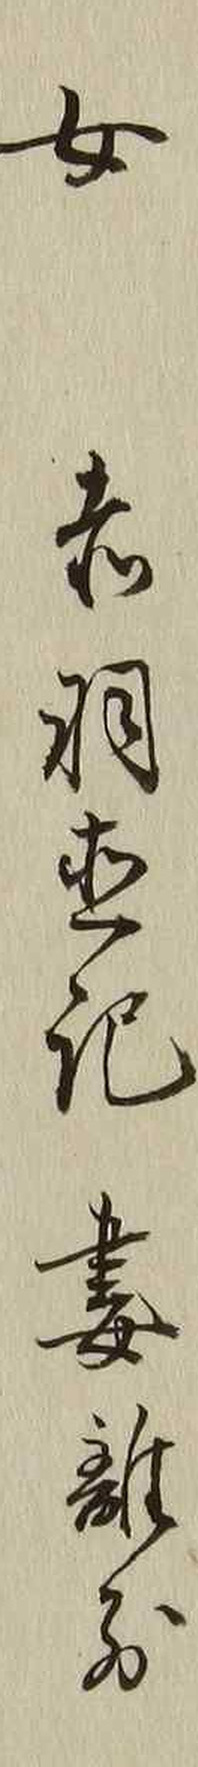女赤羽直記妻離別
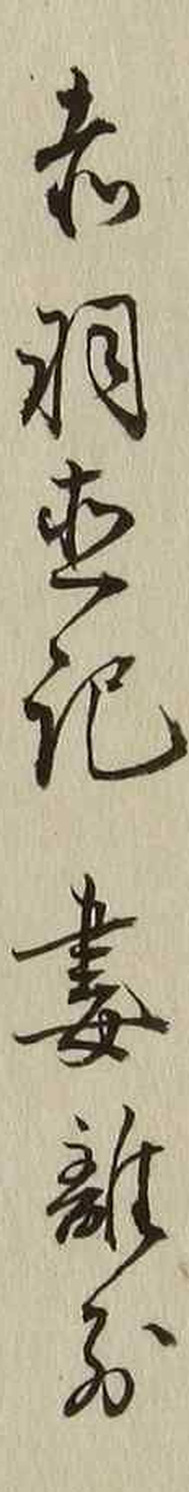女赤羽直記妻離別
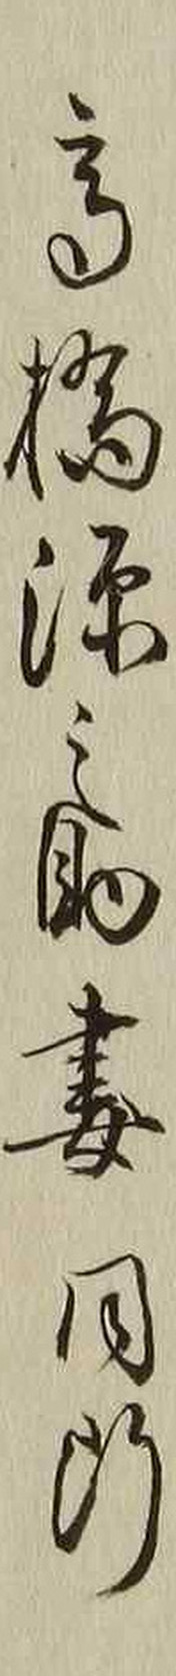高橋源之助妻同断
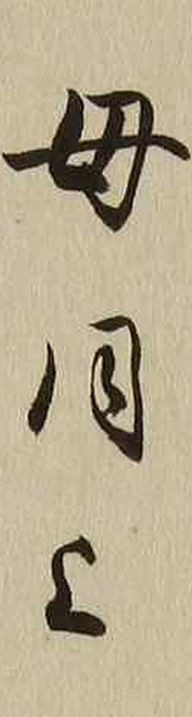母同上
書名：諸士系譜　巻之57　ほ之部4
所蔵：会津若松市立会津図書館
